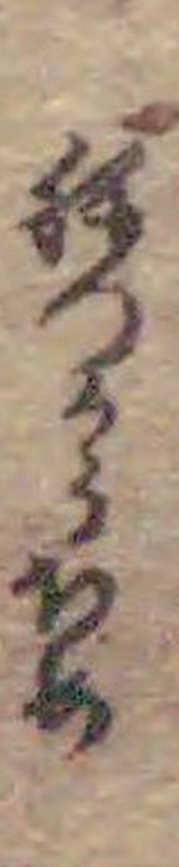ねつからほめ
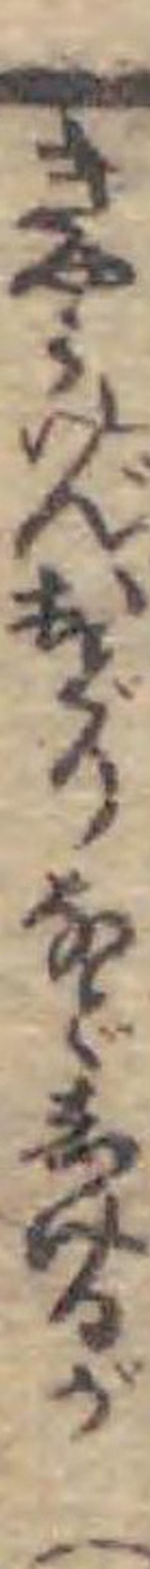きやうげんおどりなどしけるが
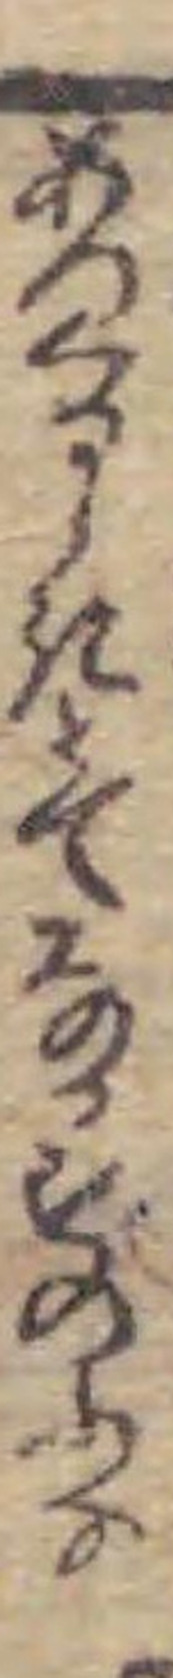あつくるしきとてなかずのふな
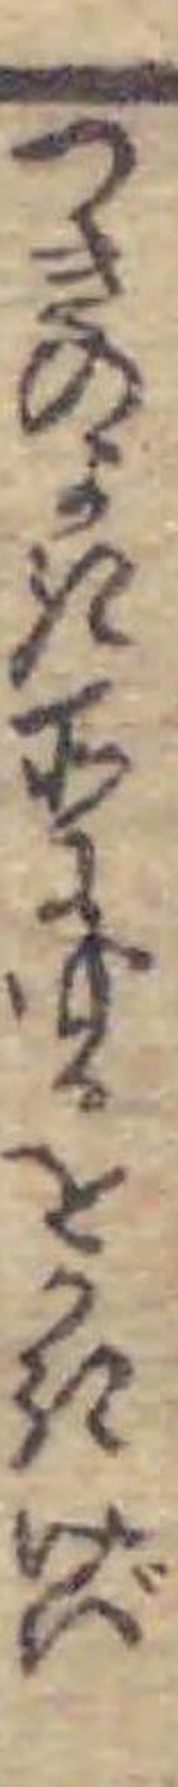つきのよき所にゆかをかきげい
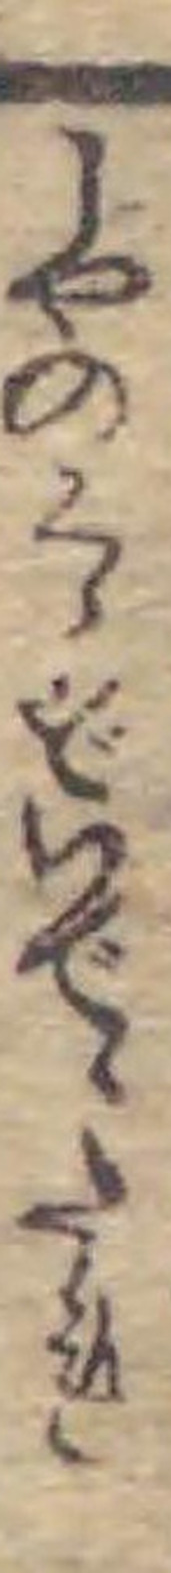しやのこらずいでゝたれ
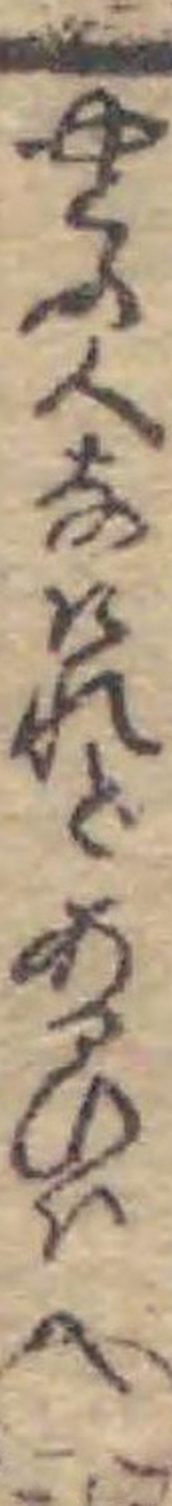やとふ人なけれどあるひは
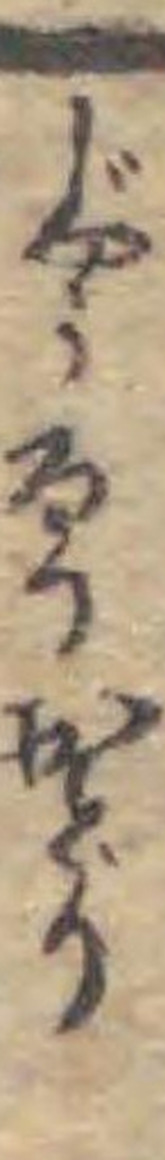じやうるりおどり
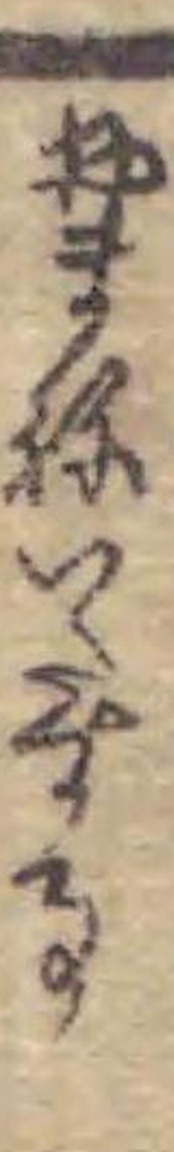おまねいたす事
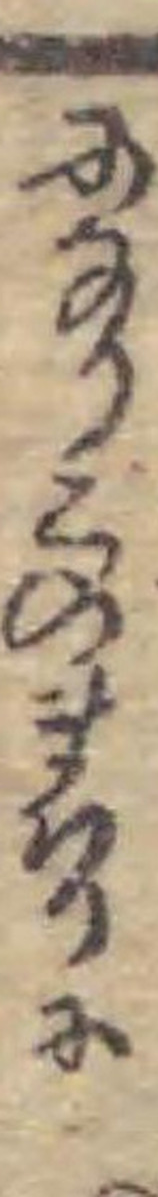になりこのまはりに
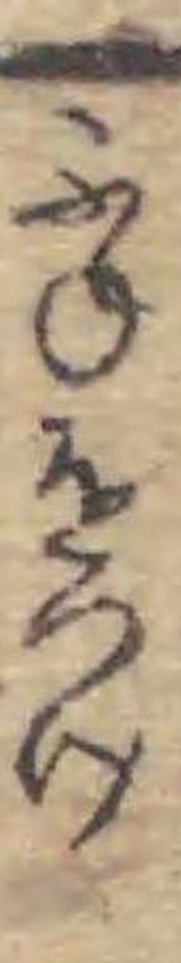ふねをつけ
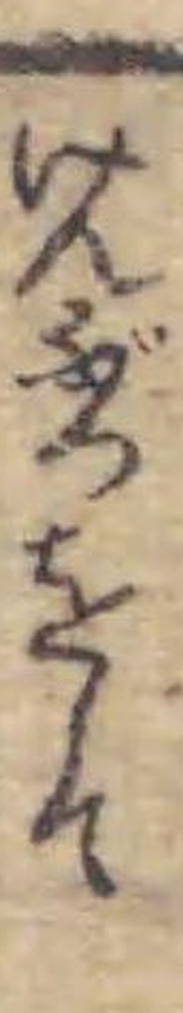けんぶつをして
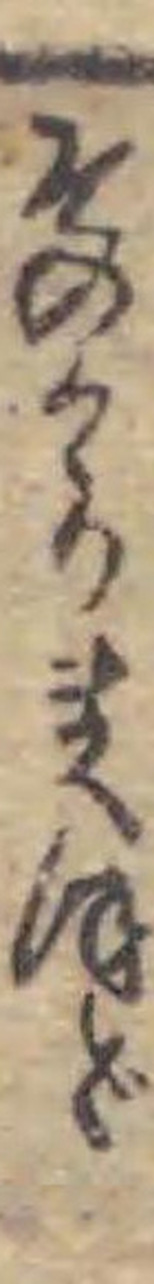そのかゝりまへほど
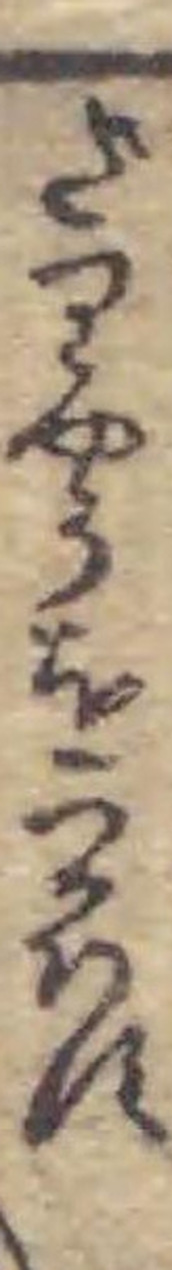ざりやうをつかはす
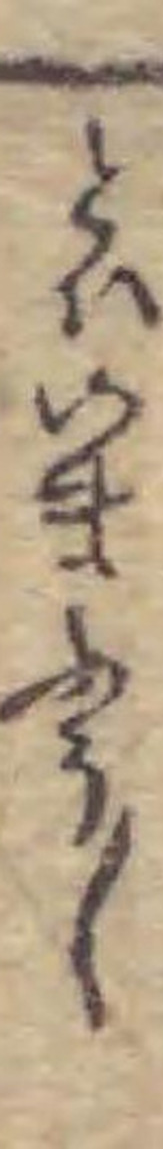とはいまふう〳〵
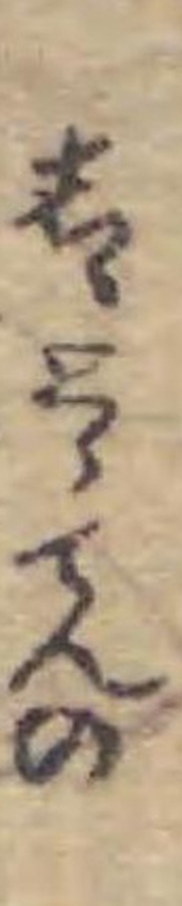しゝとらてんの
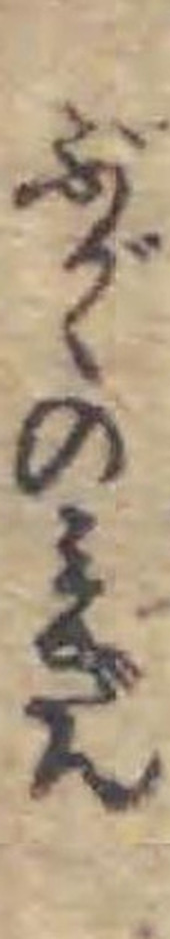ぶがくのみぎ？ん
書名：威気千代牟物語 : 2巻
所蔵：国立国会図書館 National Diet Library, JAPAN
